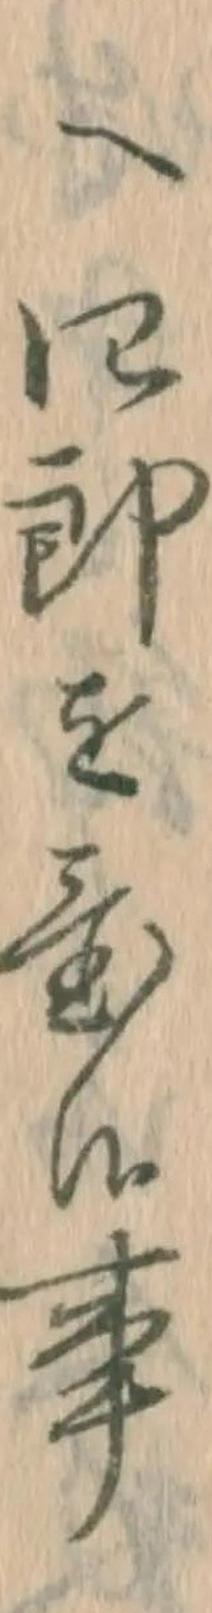へ四郎を置候事
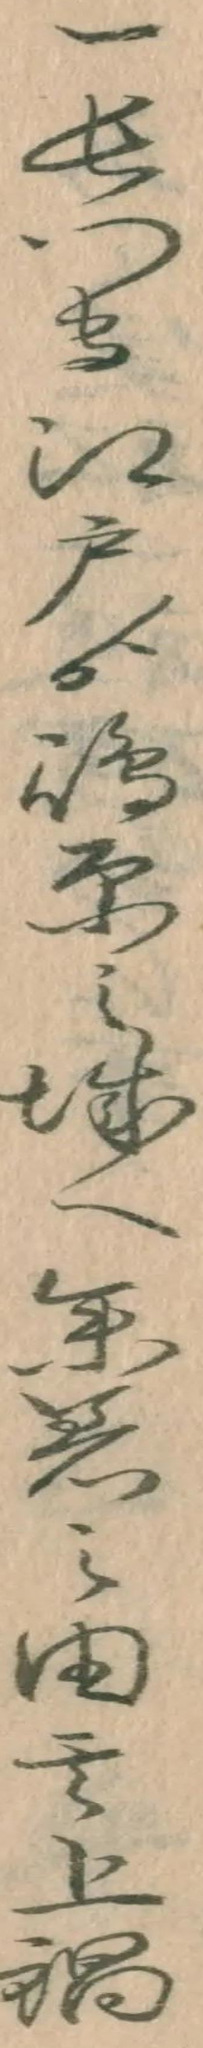一長門守江戸ゟ島原之城へ参着之由其上鍋
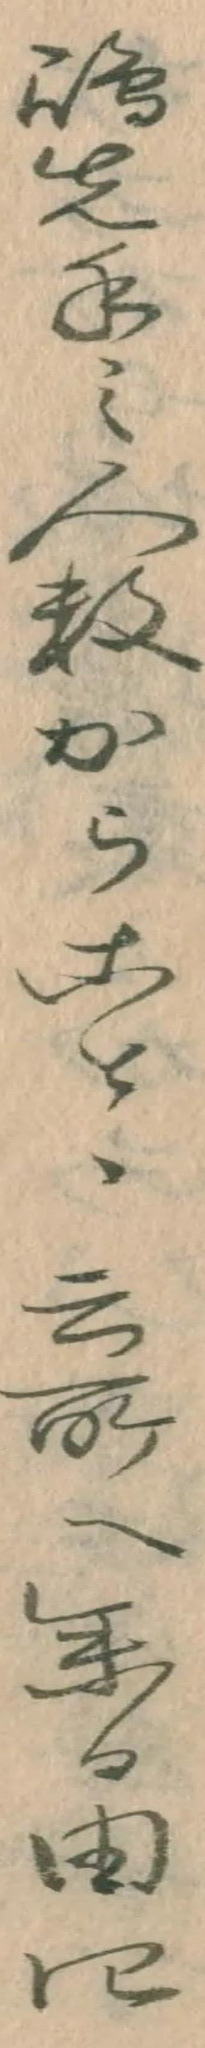島先手之人数から古とゝ云所へ参る由四
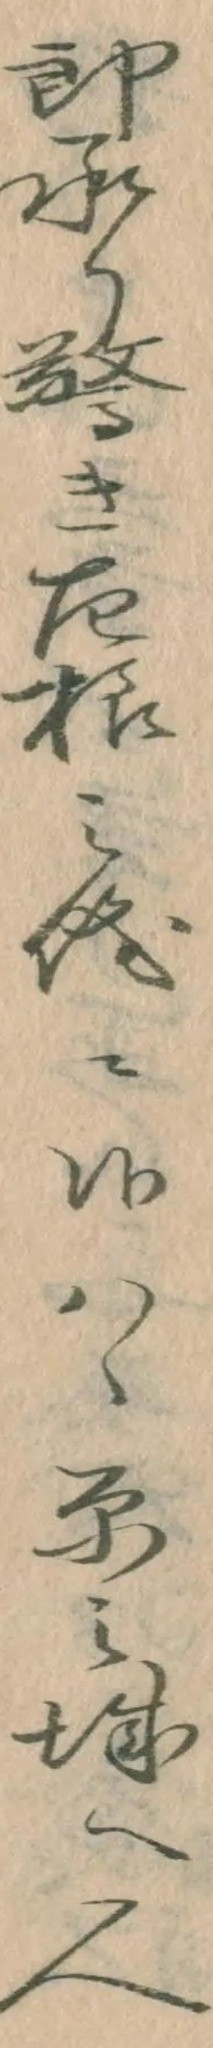郎承り驚き左様之儀に候はゝ原之城へ人
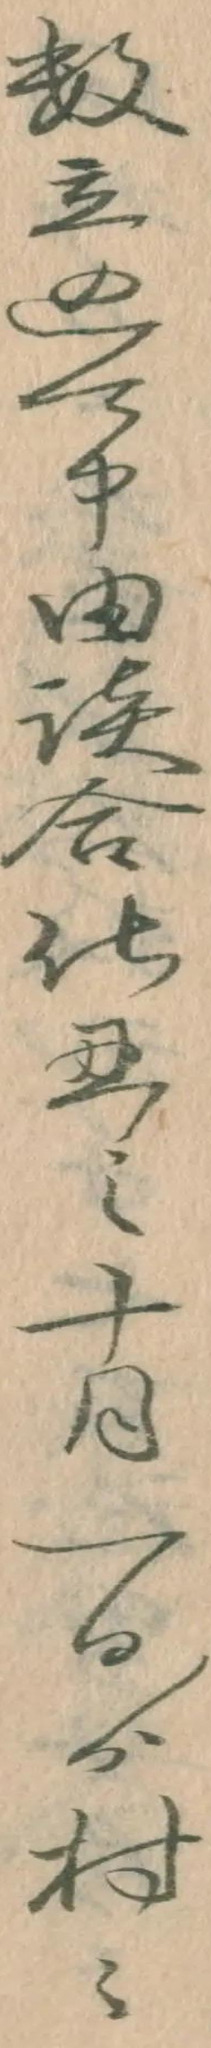数立込可申由談合仕丑之十月一日ゟ村々
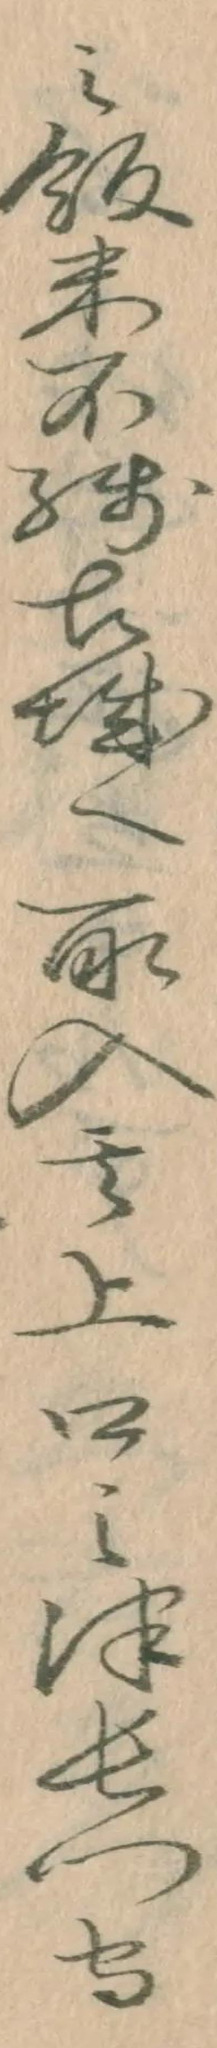之飯米不残古城へ取入其上口之津長門守
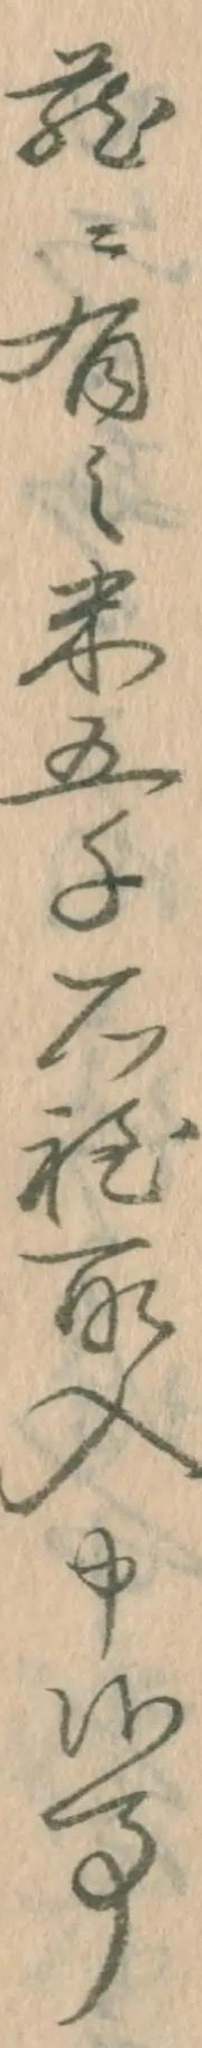蔵に有之米五千石程取入申候事
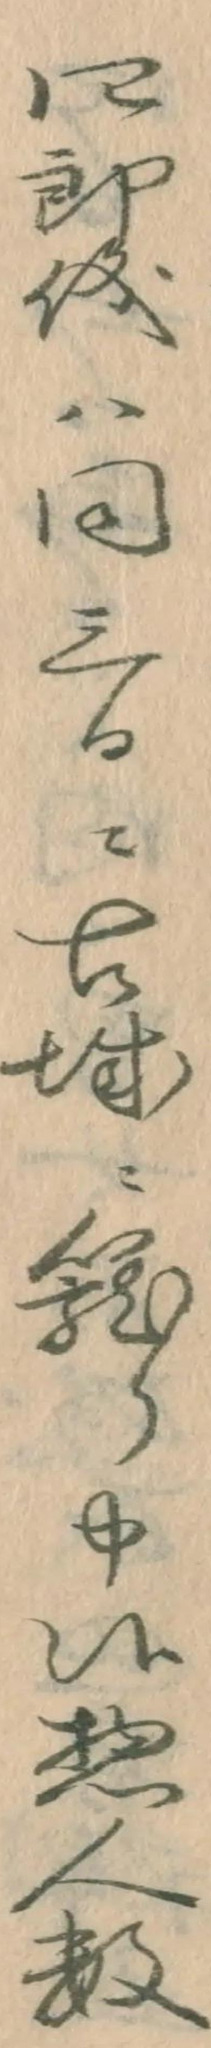一四郎儀は同三日に古城に籠り申候惣人数

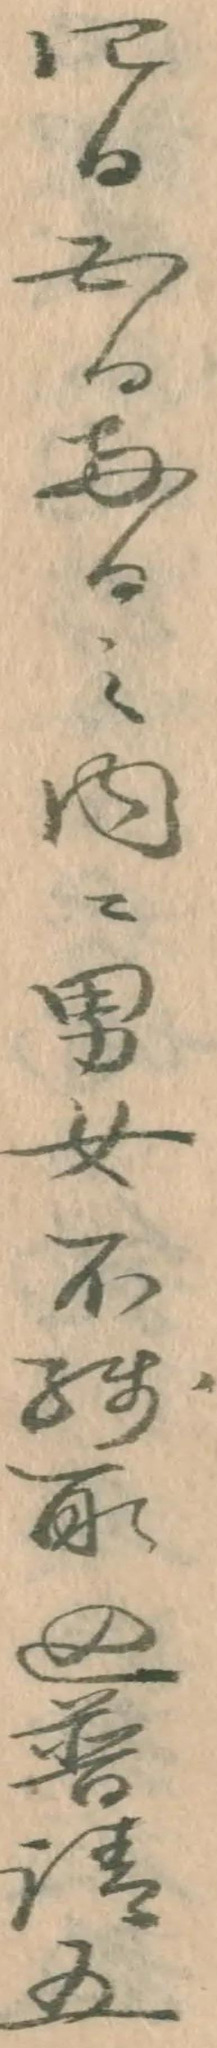四日五日両日之内に男女不残取込普請五
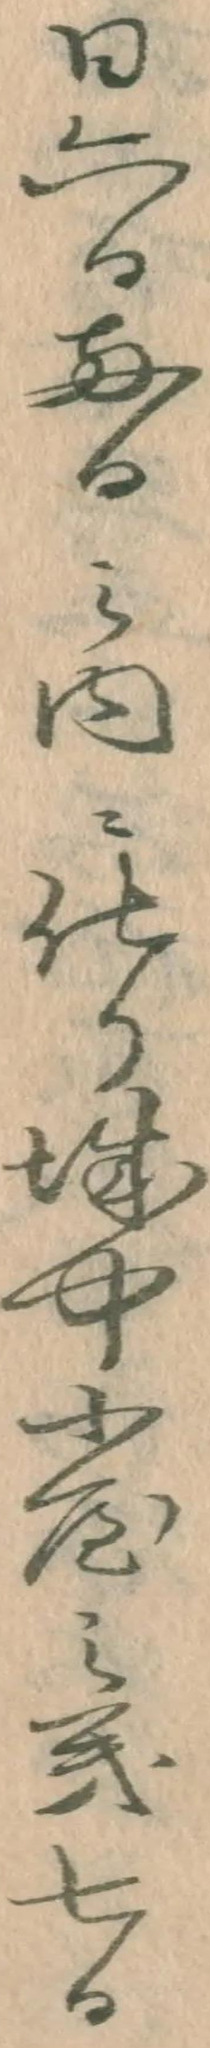日六日両日之内に仕り城中小屋之義七日
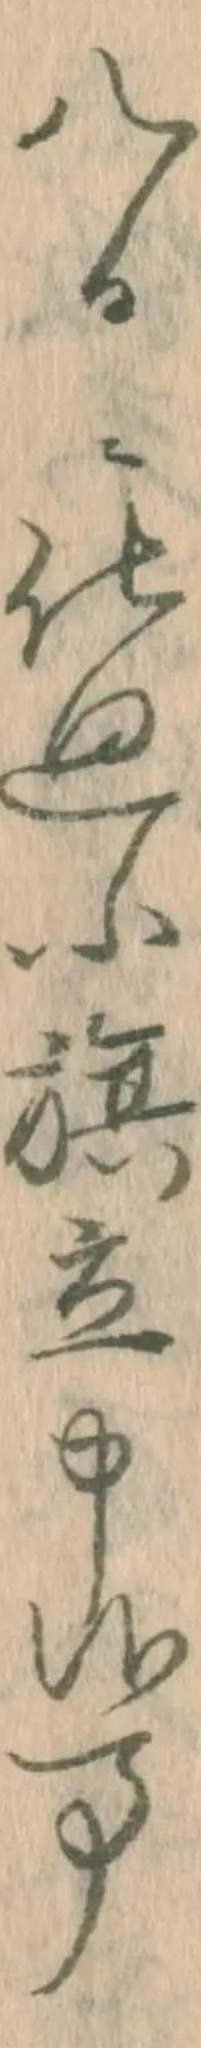八日に仕廻小旗立申候事
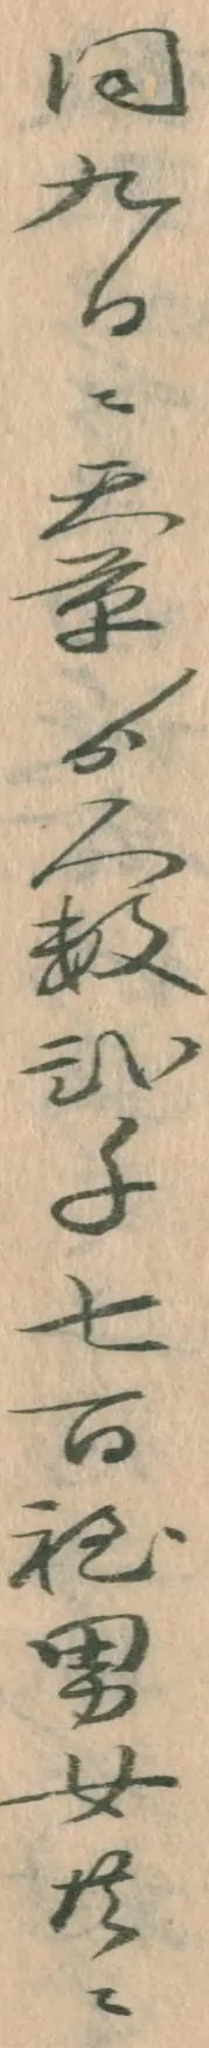一同九日に天草ゟ人数弐千七百程男女共に
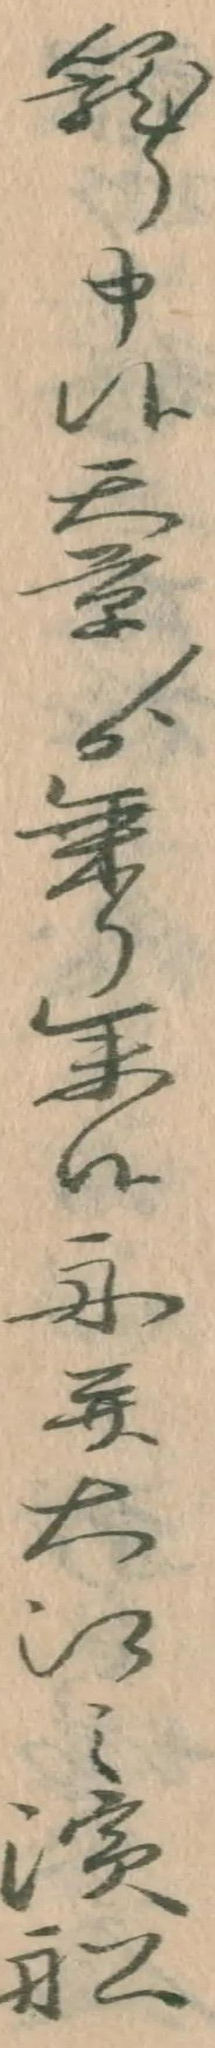籠り申候天草ゟ乗り参候舟幷大江之浜舩
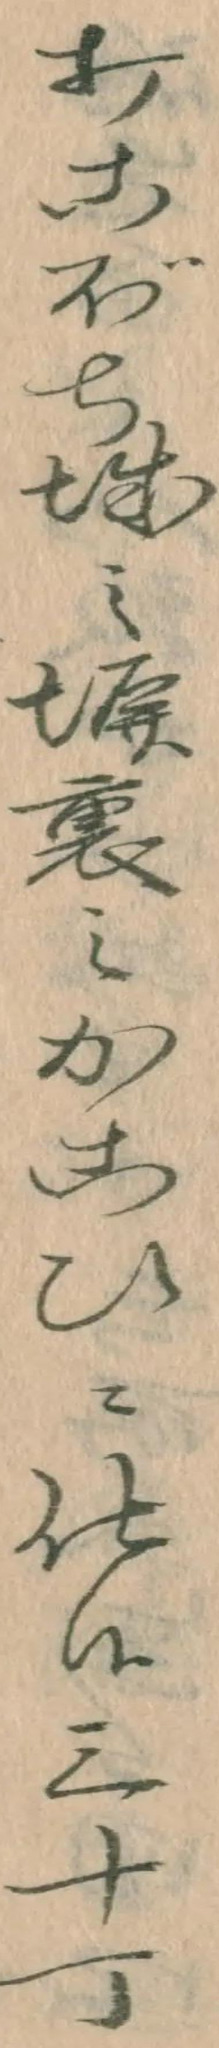打古不古城之塀裏之か古ひに仕候三十丁
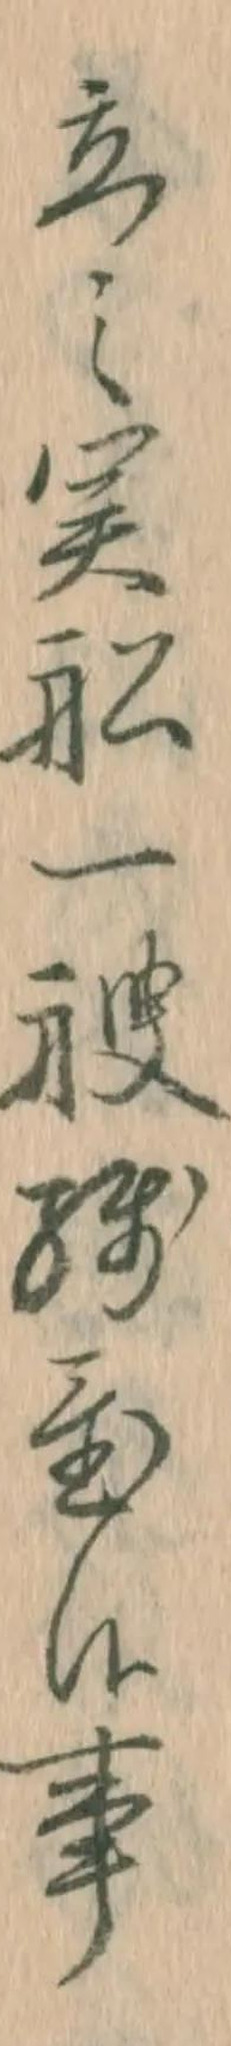立之関舩一艘残置候事
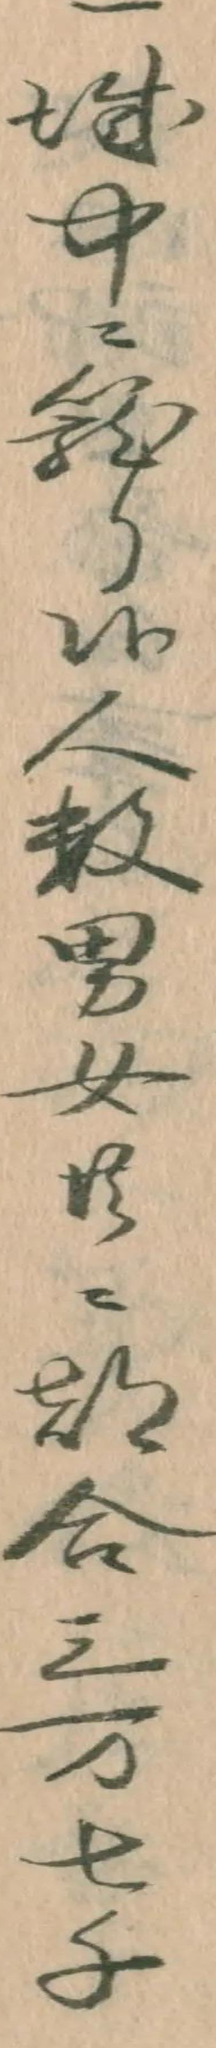一城中に籠り候人数男女共に都合三万七千
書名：切支丹御退治記 49巻. [9]
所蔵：国立国会図書館 National Diet Library, JAPAN
